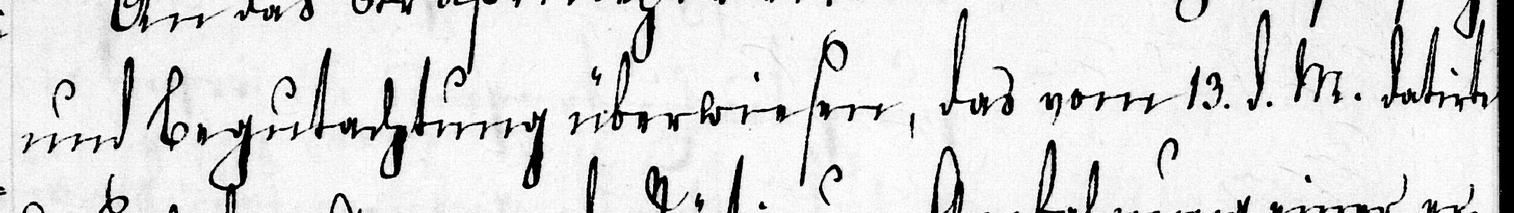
und Begutachtung überwiesen, das vom 13. d. M. datirte
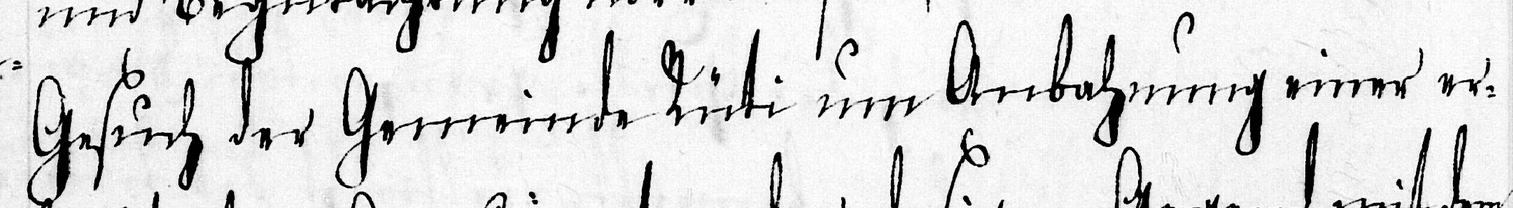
Gesuch der Gemeinde Rüti um Anbahnung einer er¬
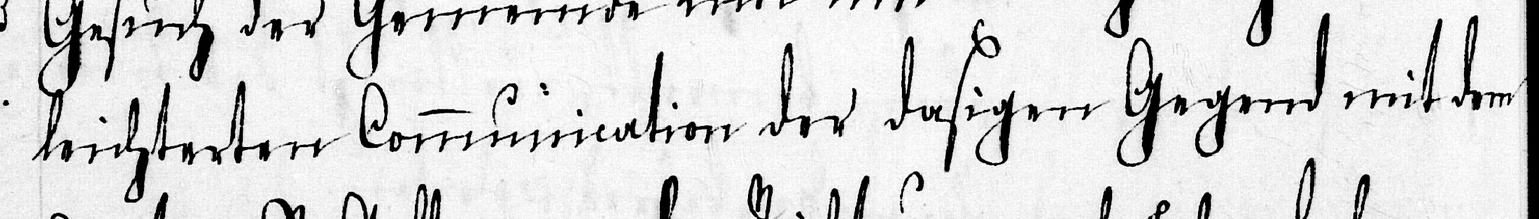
leichterten Communication der dasigen Gegend mit dem
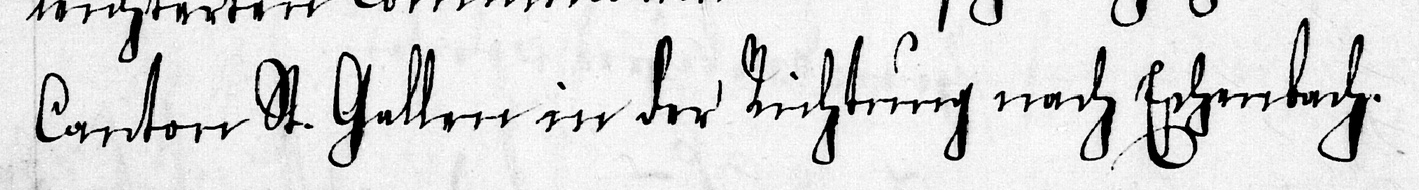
Canton St. Gallen in der Richtung nach Eschenbach.
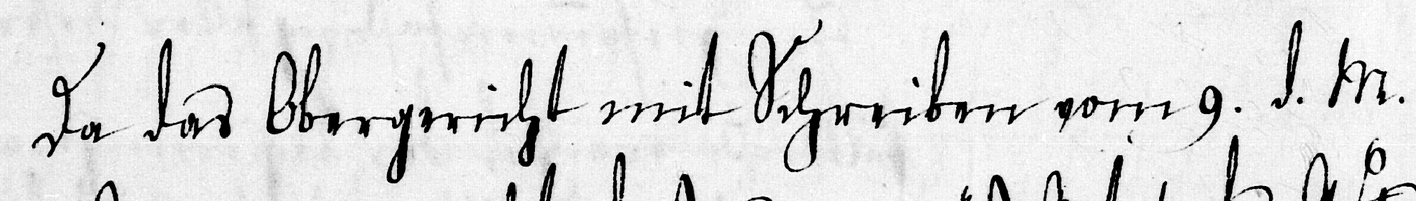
Da das Obergericht mit Schreiben vom 9. d. M.
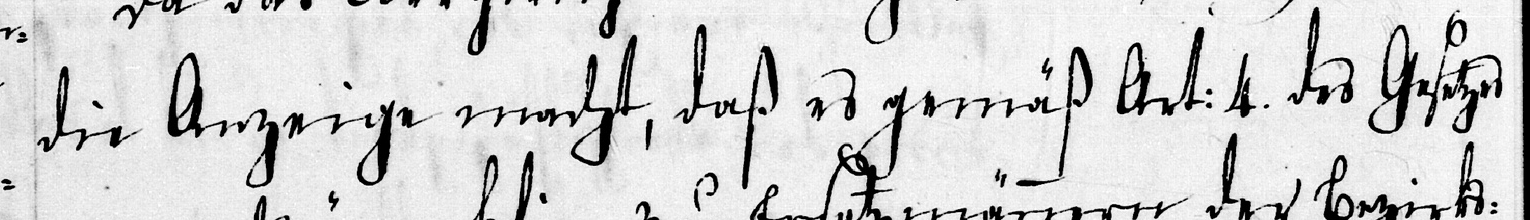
die Anzeige macht, daß es gemäß Art: 4. des Gesetz¬
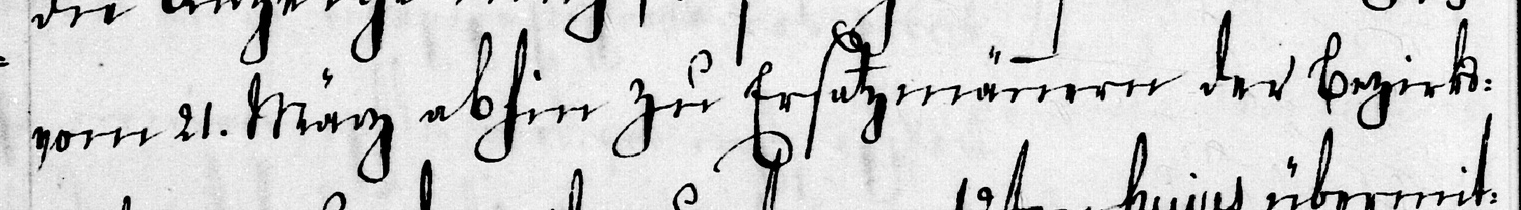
vom 21. März abhin zu Ersatzmännern der Bezirks¬
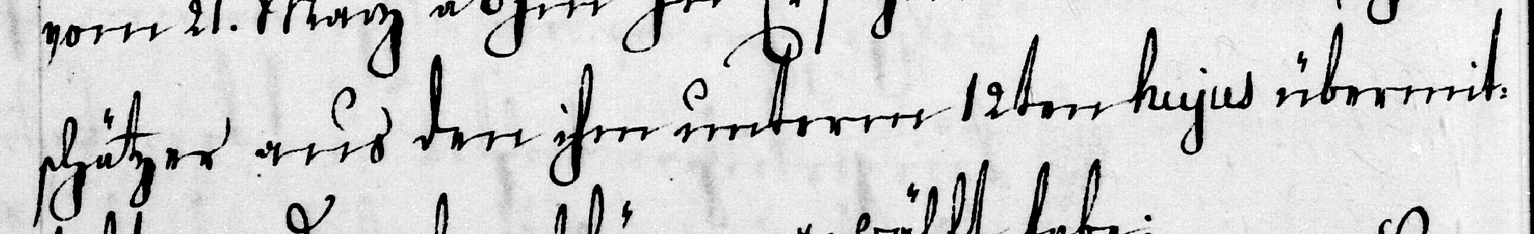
schätzer aus den ihm unterm 12ten hujus übermit¬
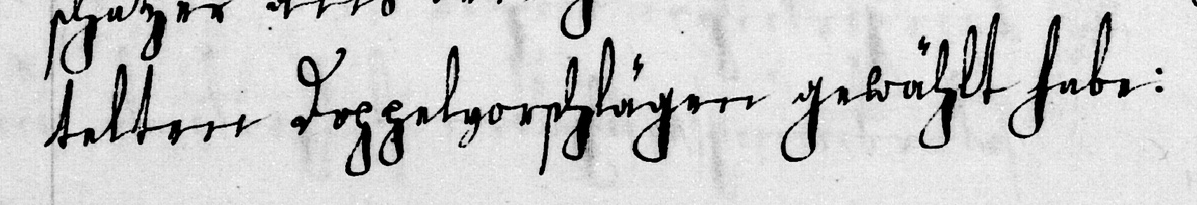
telten Doppelvorschlägen gewählt habe:
